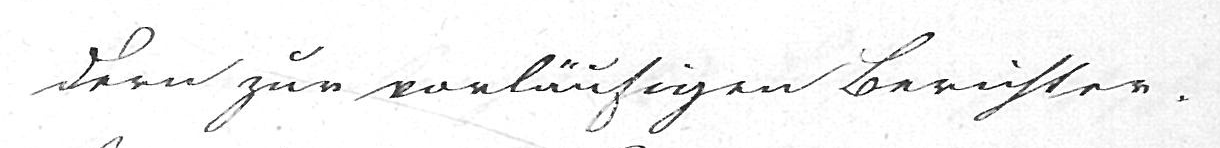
dern zur vorläufigen Berichter-
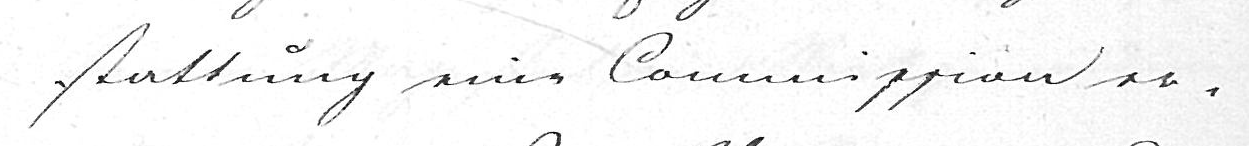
stattung eine Commission er-
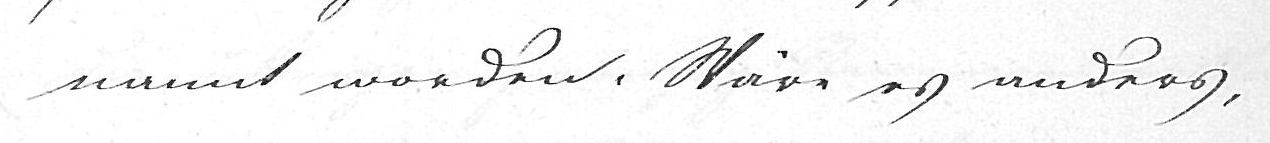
nannt worden. Wäre es anders,
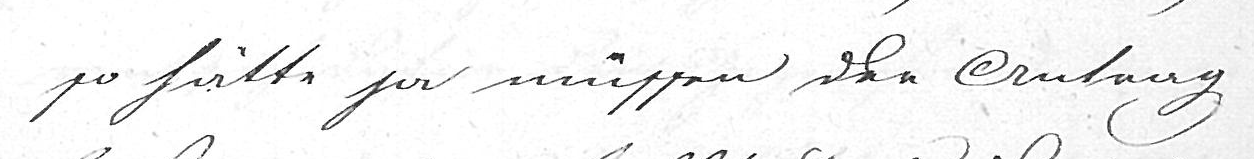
so hätte ja müssen der Antrag
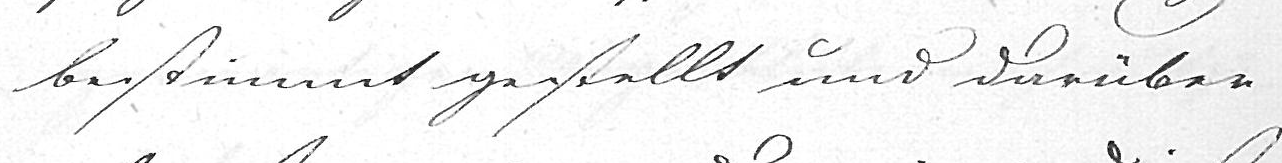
bestimmt gestellt und darüber
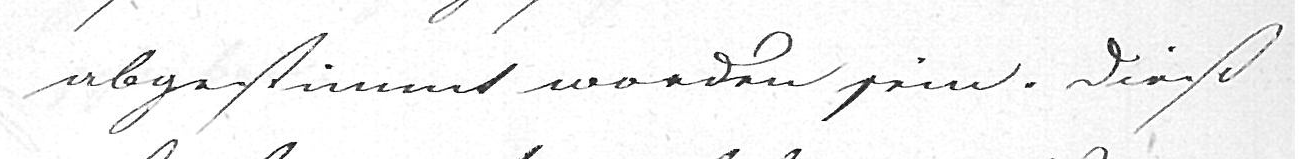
abgestimmt worden sein. Dieß
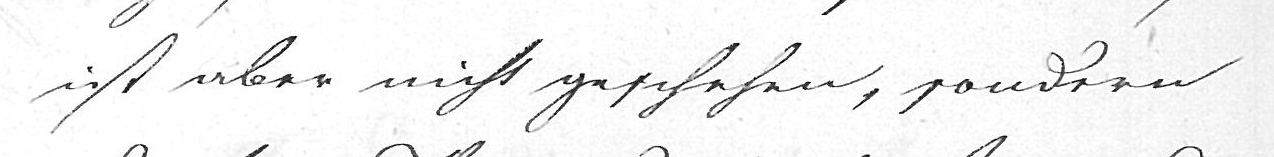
ist aber nicht geschehen, sondern
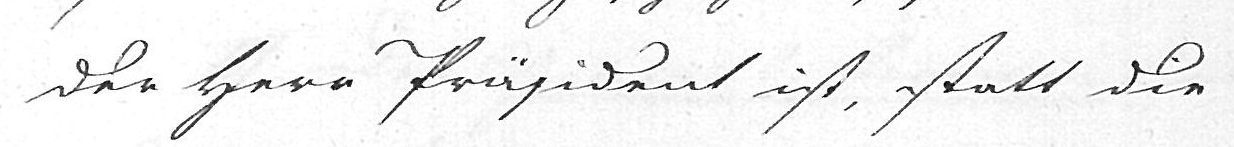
der Herr Präsident ist, statt die
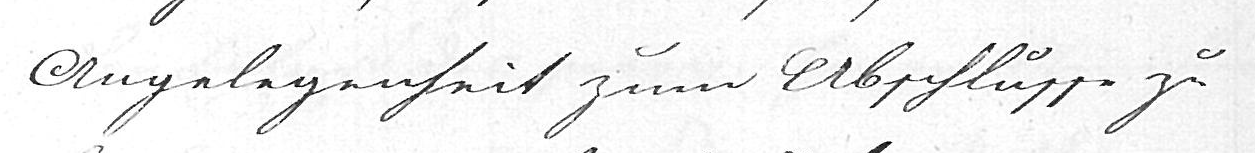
Angelegenheit zum Abschlusse zu
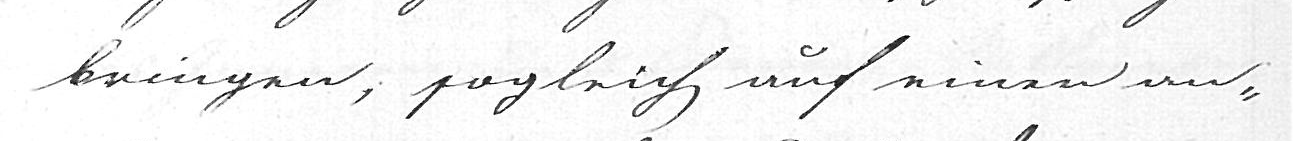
bringen, sogleich auf einen an-
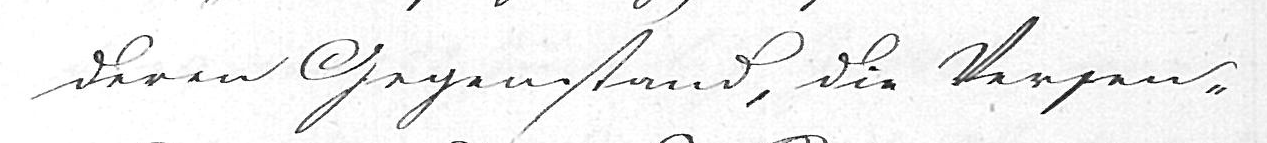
deren Gegenstand, die Versen-
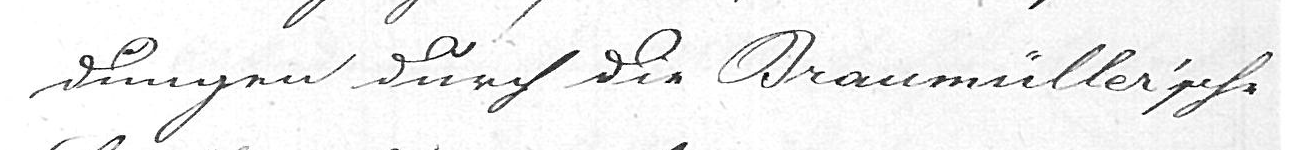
dungen durch die Braumüller'sche
